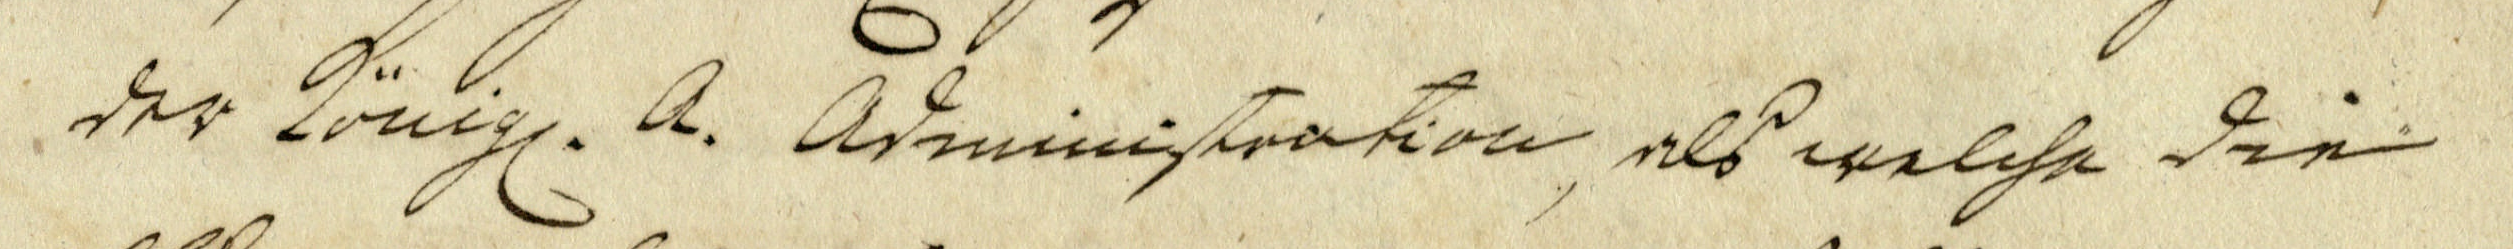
der Königl. A. Administration, als welche die
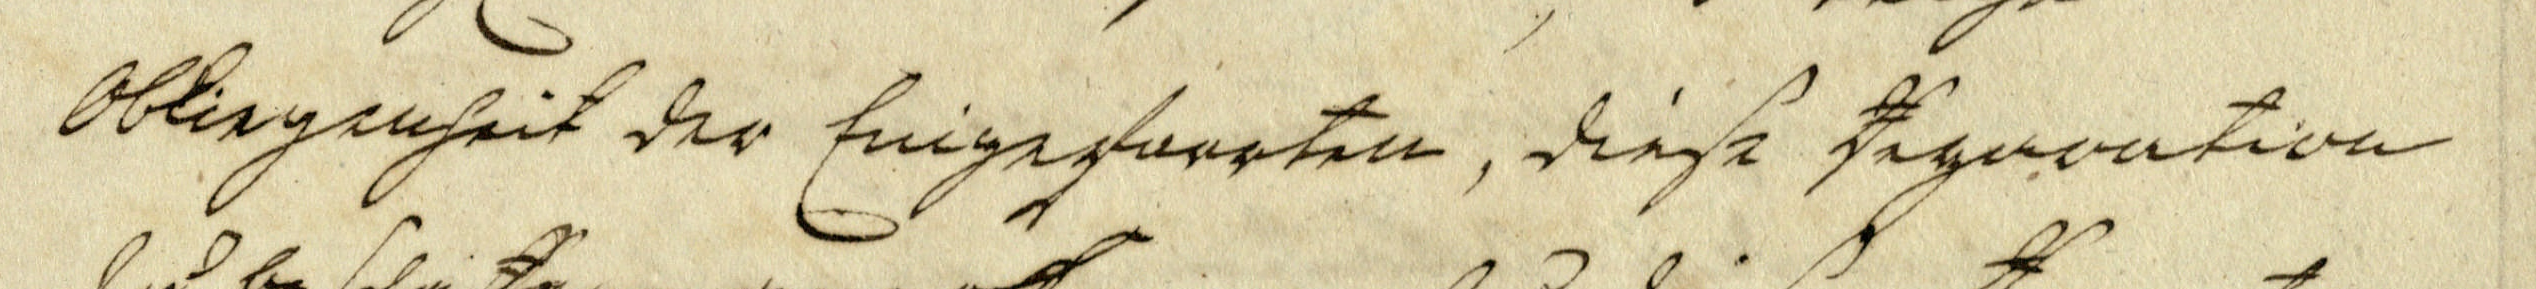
Obliegenheit der Eingepfarrten, diese Reparation
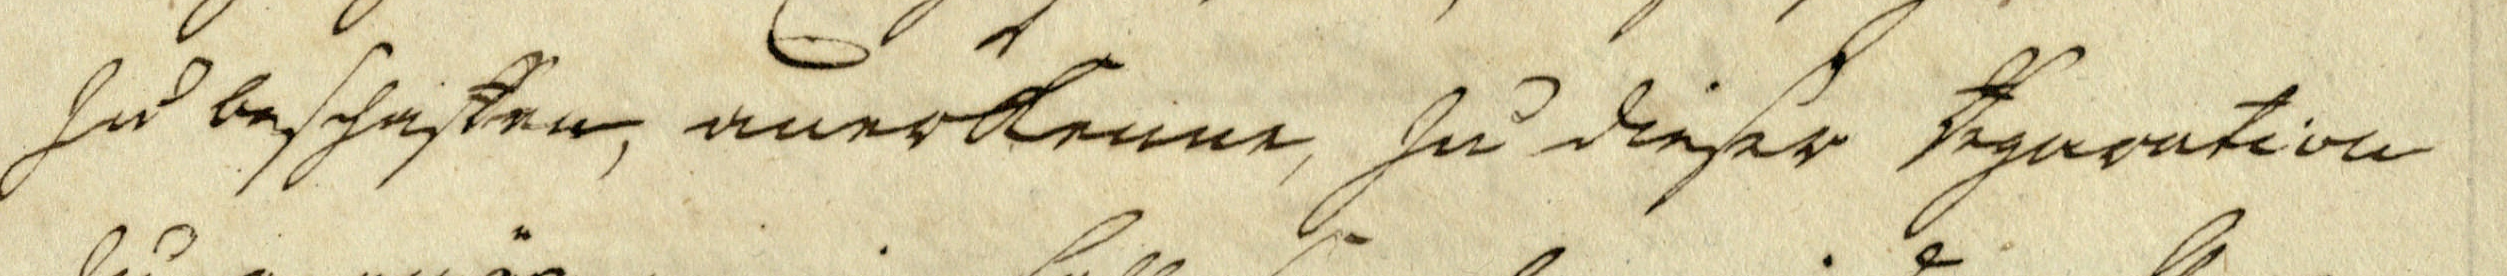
zu beschaffen, anerkenne, zu dieser Reparation
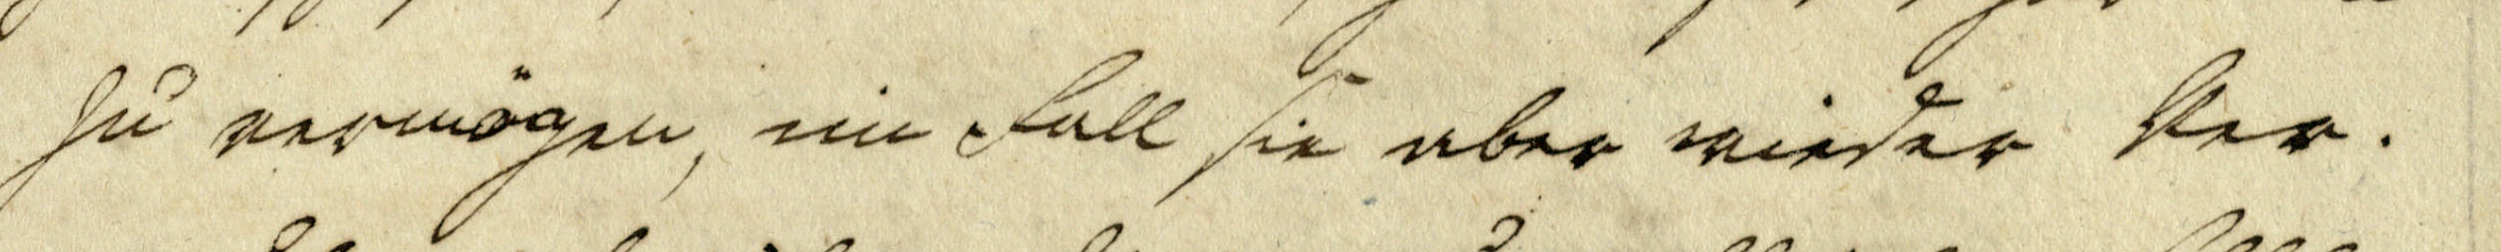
zu vermögen, im Fall sie aber wieder Ver¬
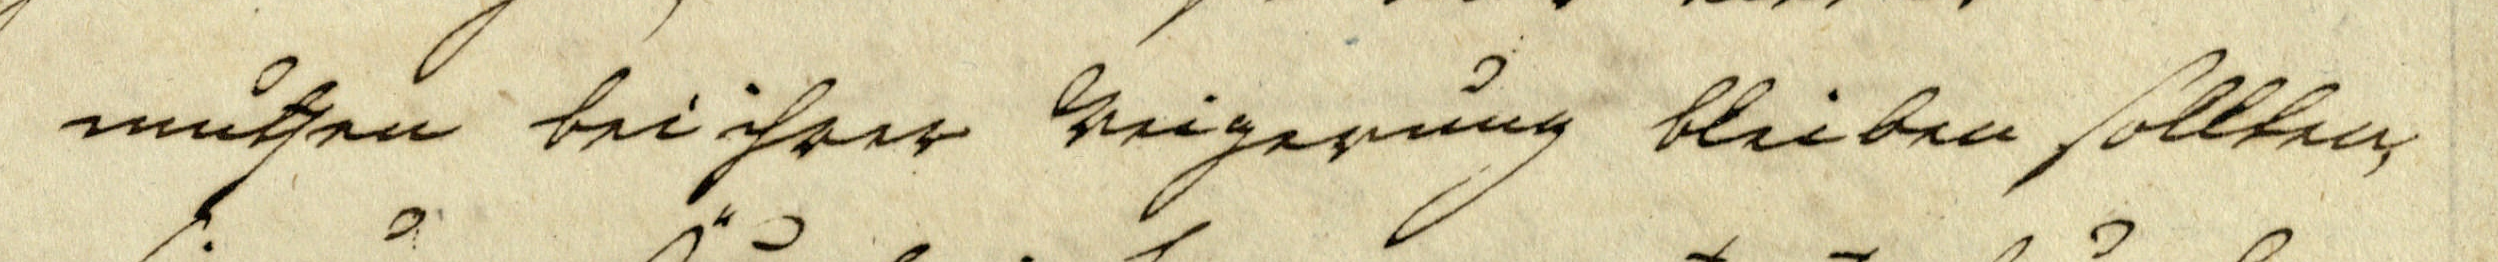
muthen bei ihrer Weigerung bleiben sollten,
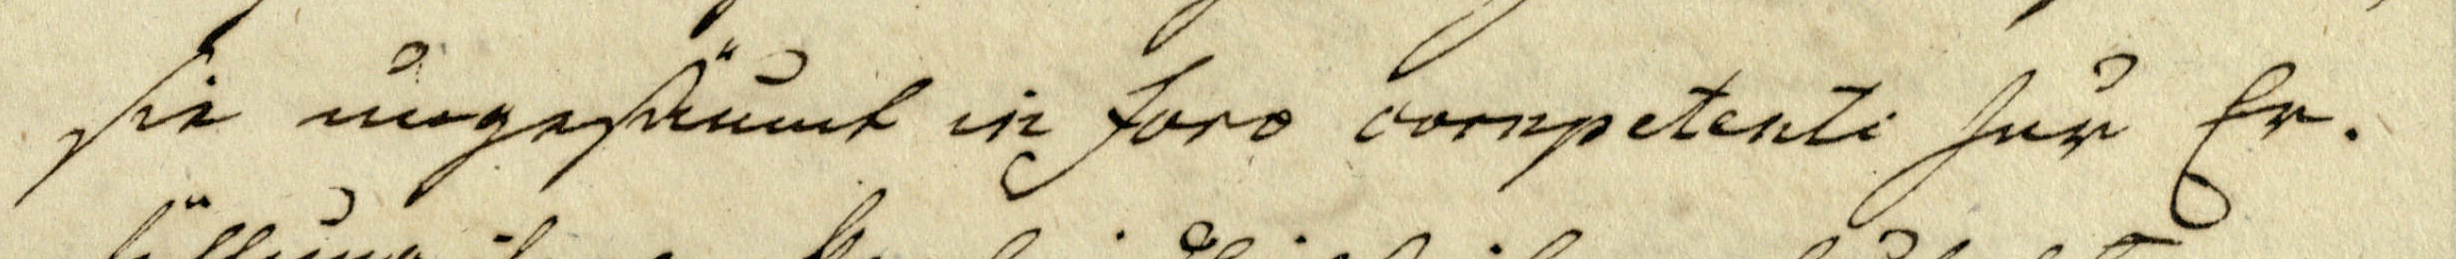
sie ungesäumt in foro competenti zur Er¬
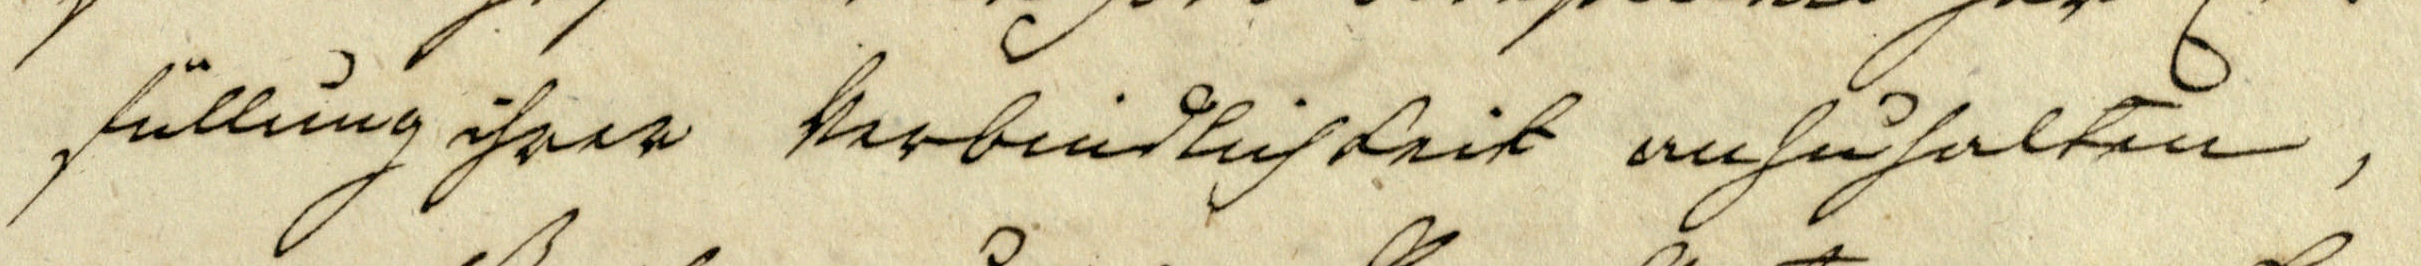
füllung ihrer Verbindlichkeit anzuhalten,
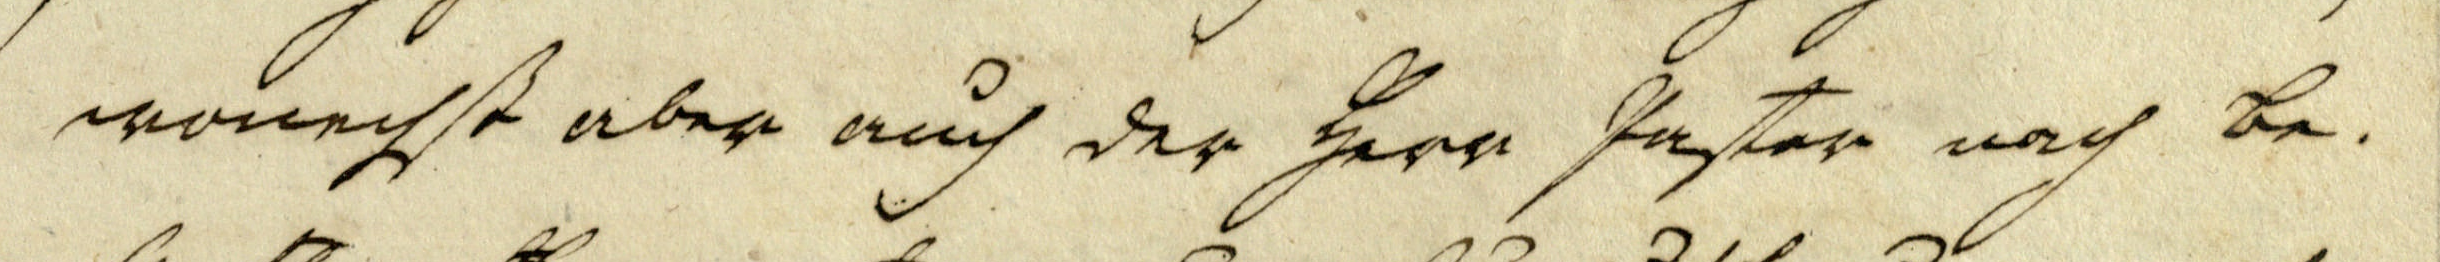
wonechst aber auch der Herr Pastor nach be¬
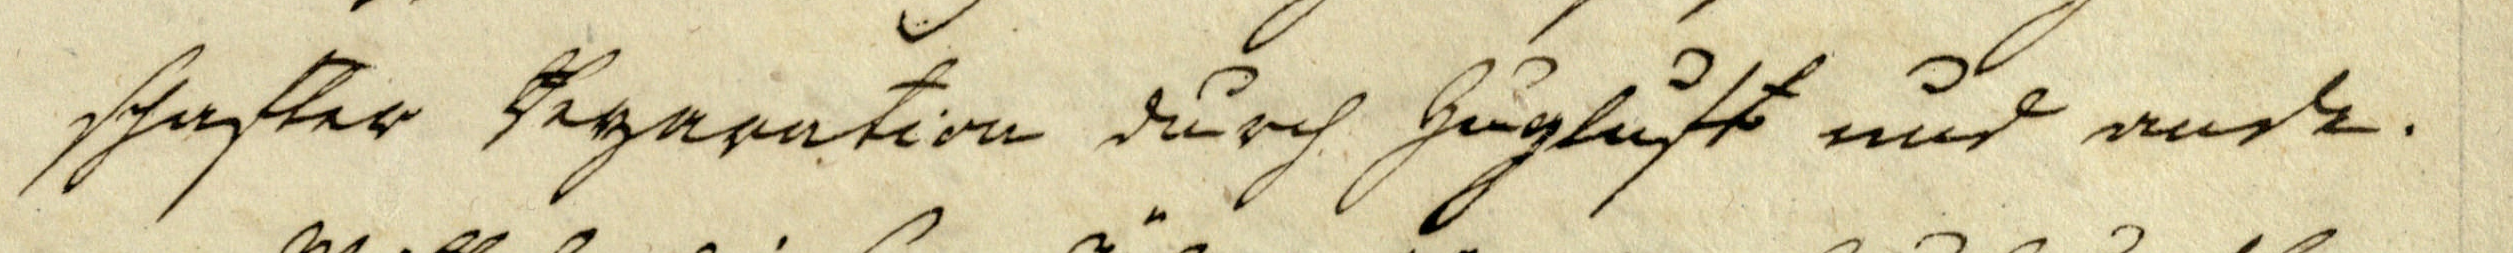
schafter Reparation durch Zugluft und ande¬
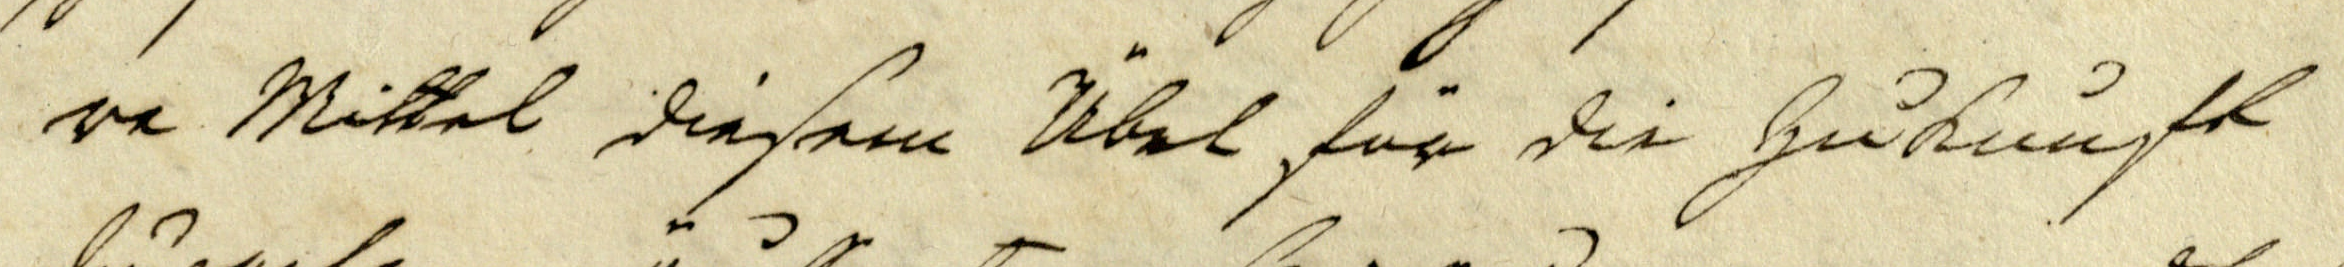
re Mittel diesem Übel für die Zukunft
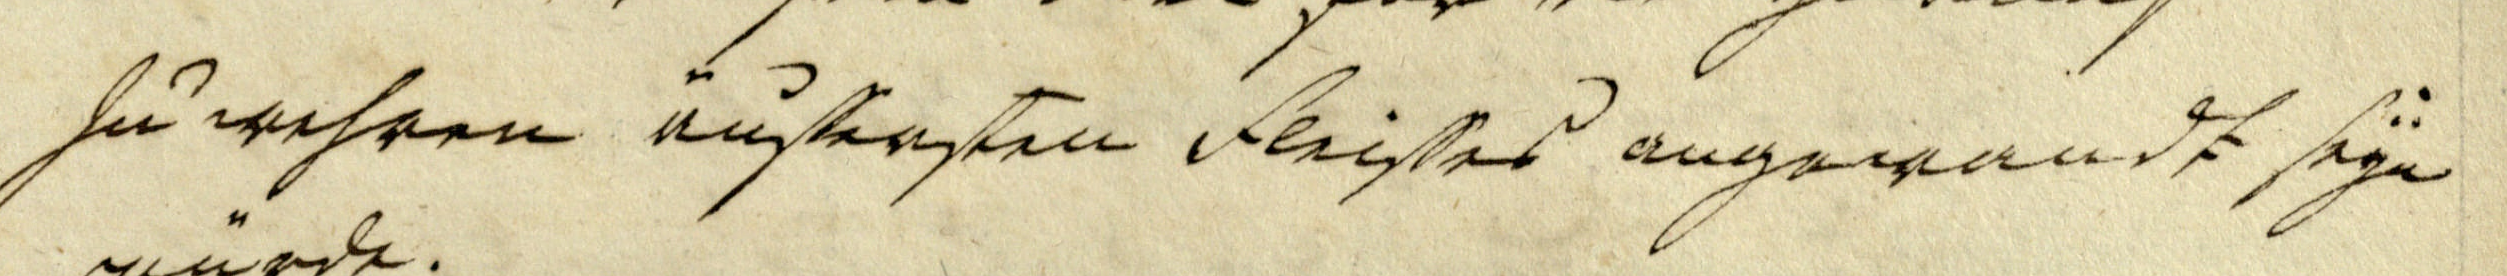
zu wehren äussersten Fleisses angewandt seÿn
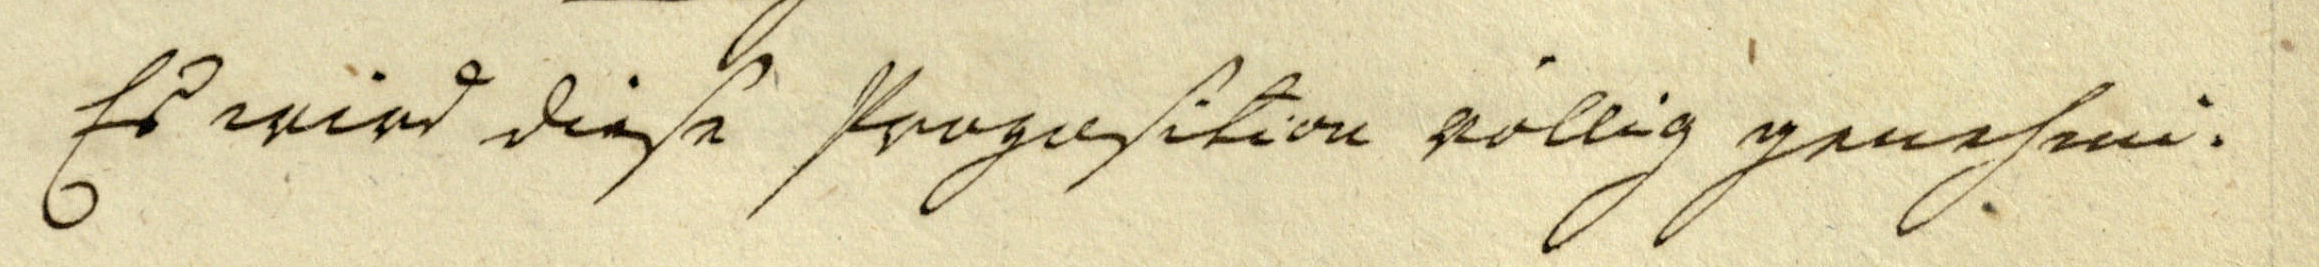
Es wird diese Proposition völlig genehemi¬
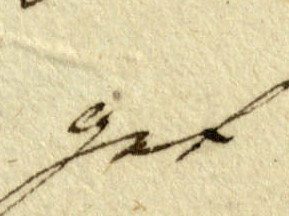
get.
